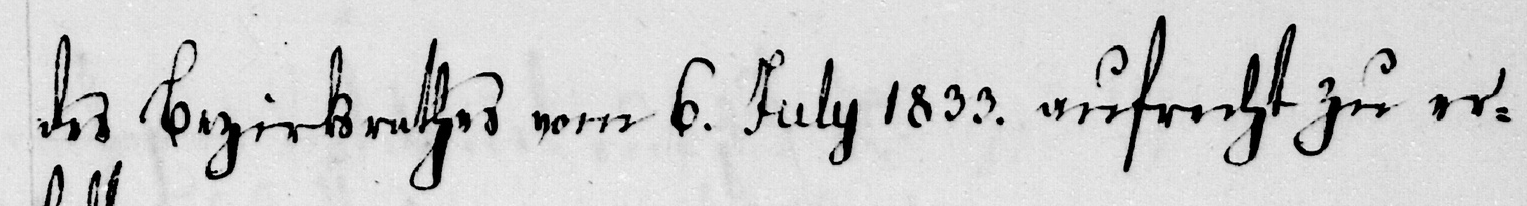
des Bezirksrathes vom 6. July 1833. aufrecht zu er¬
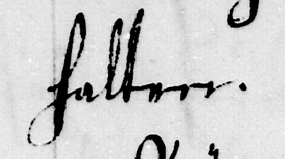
halten.
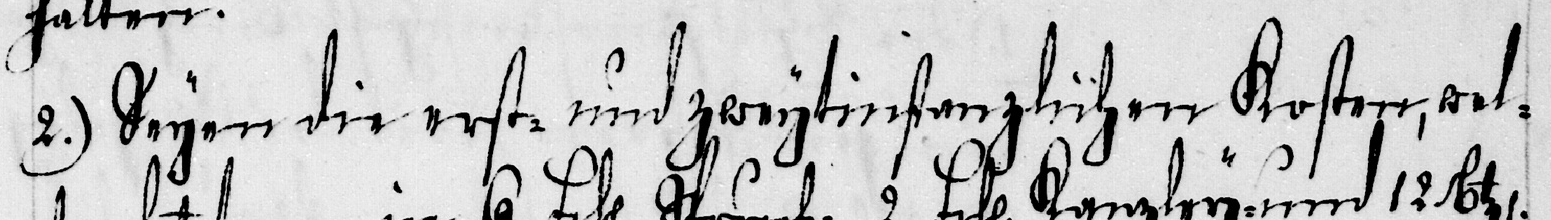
2.) Seyen die erst- und zweytinstanzlichen Kosten, wel¬
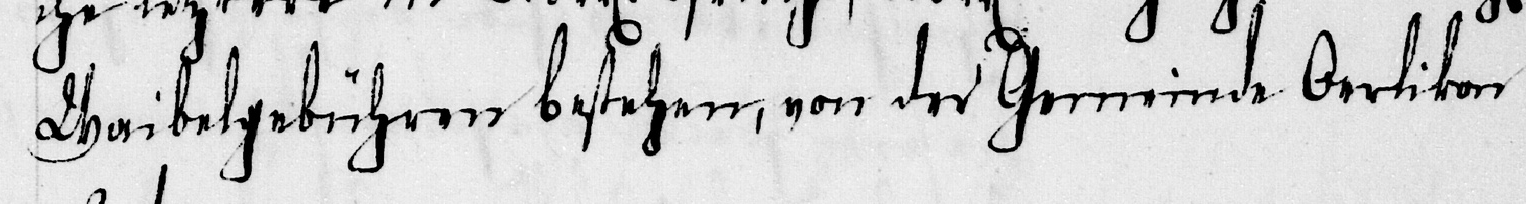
Waibelgebühren bestehen, von der Gemeinde Oerlikon
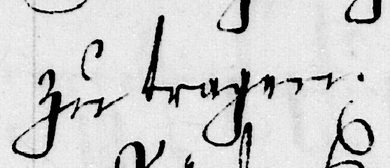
zu tragen.
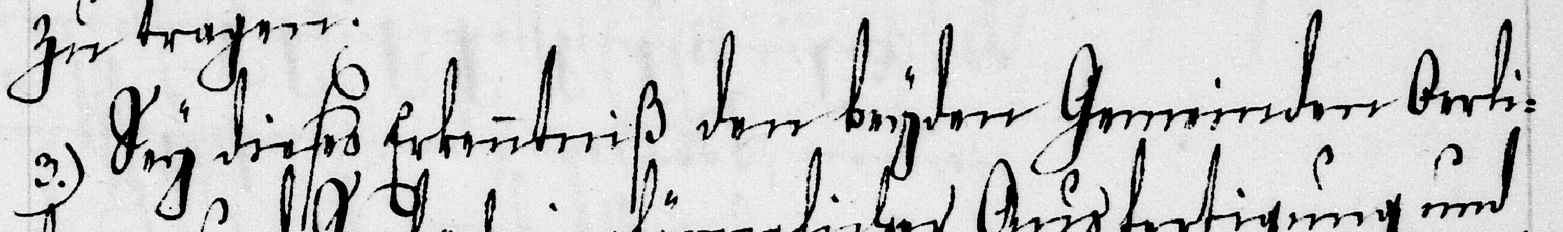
3.) Sey dieses Erkenntniß den beyden Gemeinden Oerli¬
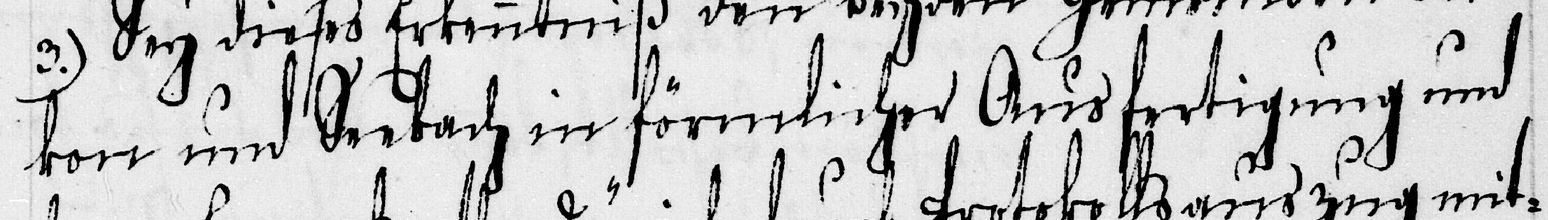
kon und Seebach in förmlicher Ausfertigung und
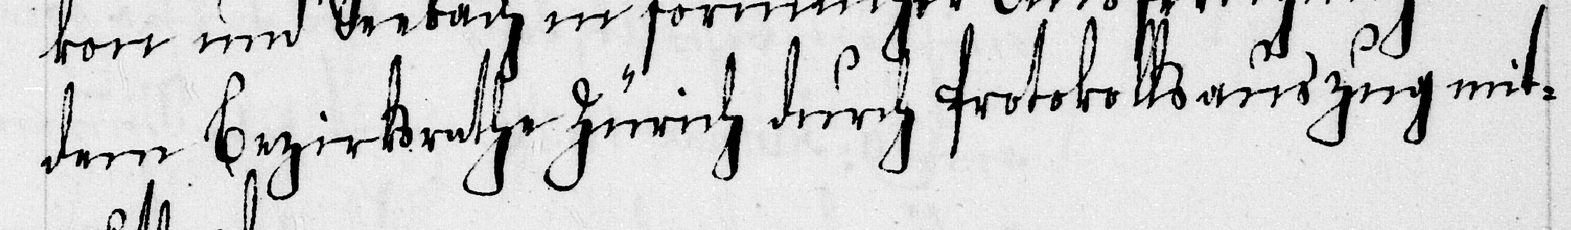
dem Bezirksrathe Zürich durch Protokollsauszug mit¬
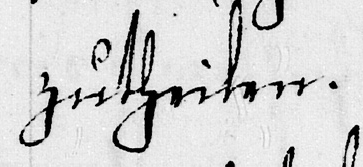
zutheilen.
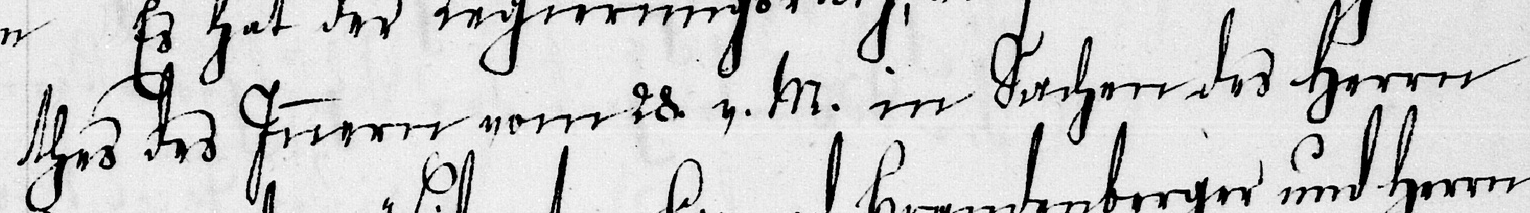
thes des Innern vom 28. v. M. in Sachen des Herrn
